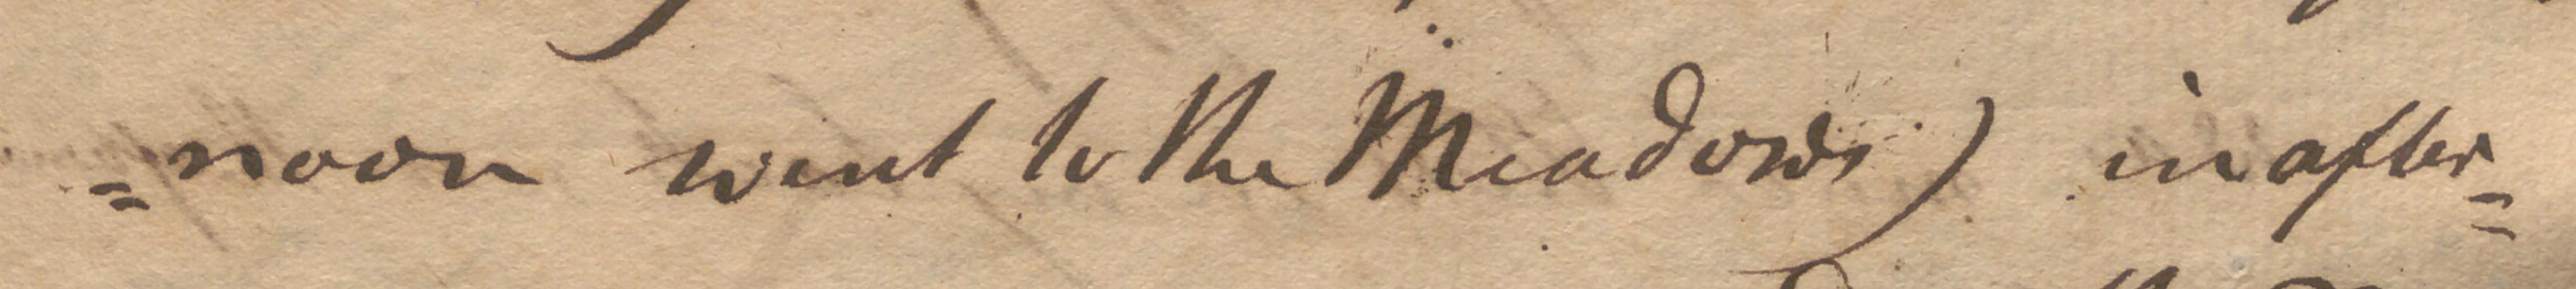-noon went to the Meadows) in after-
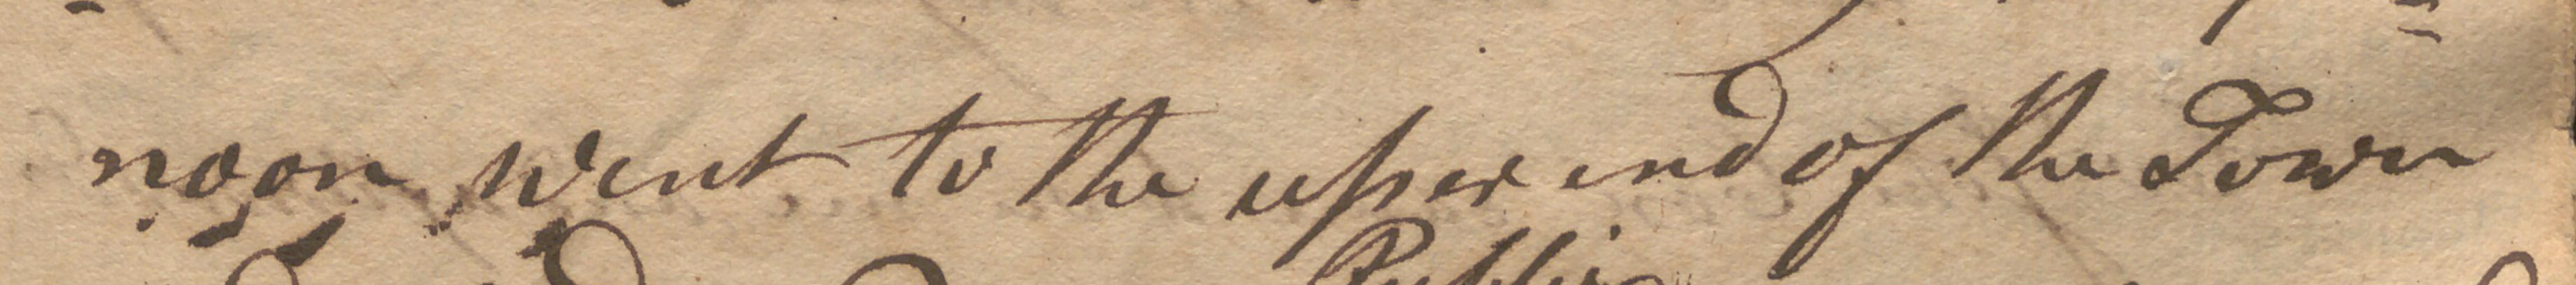noon went to the uper end of the Town
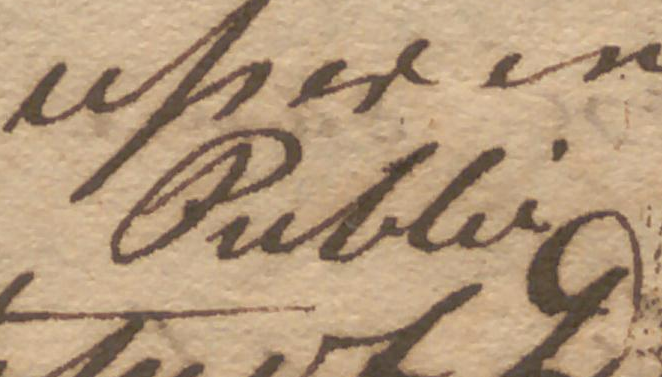Public
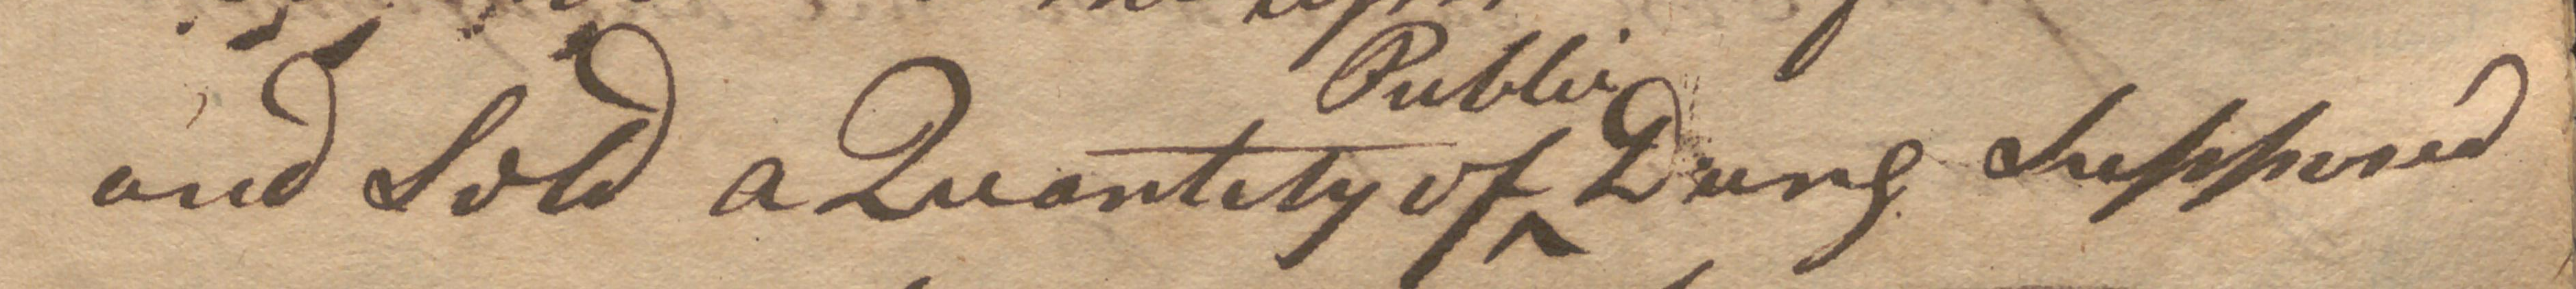and sold a Quantity of ^ Dung supposed
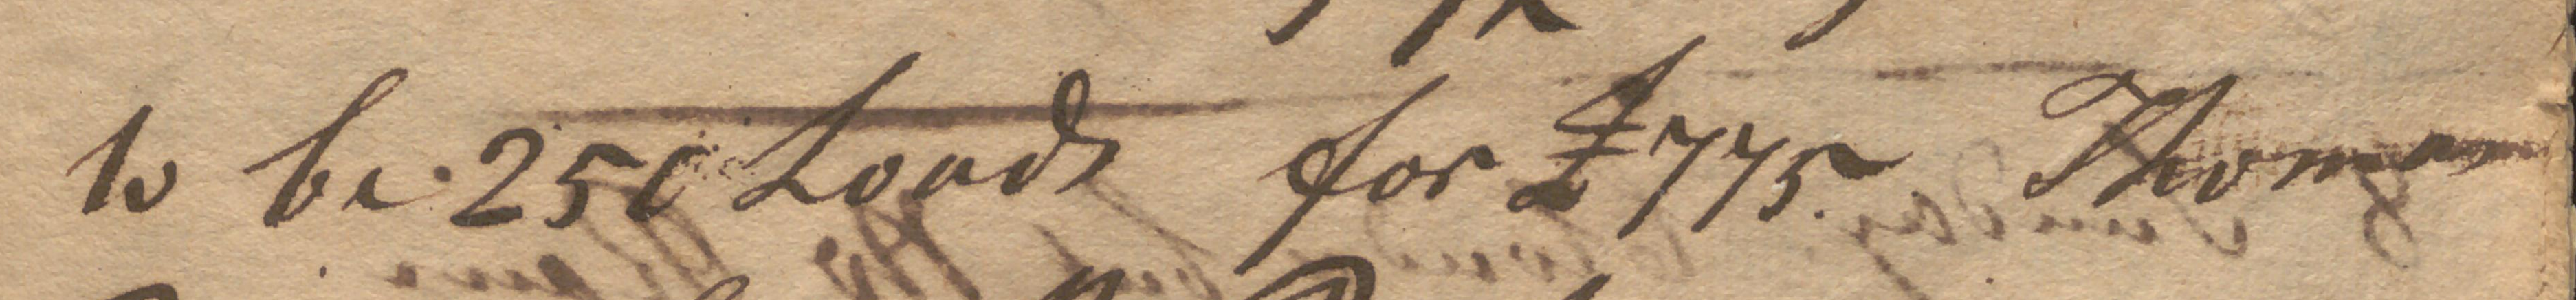to be 250 Loads for £775. Thoma
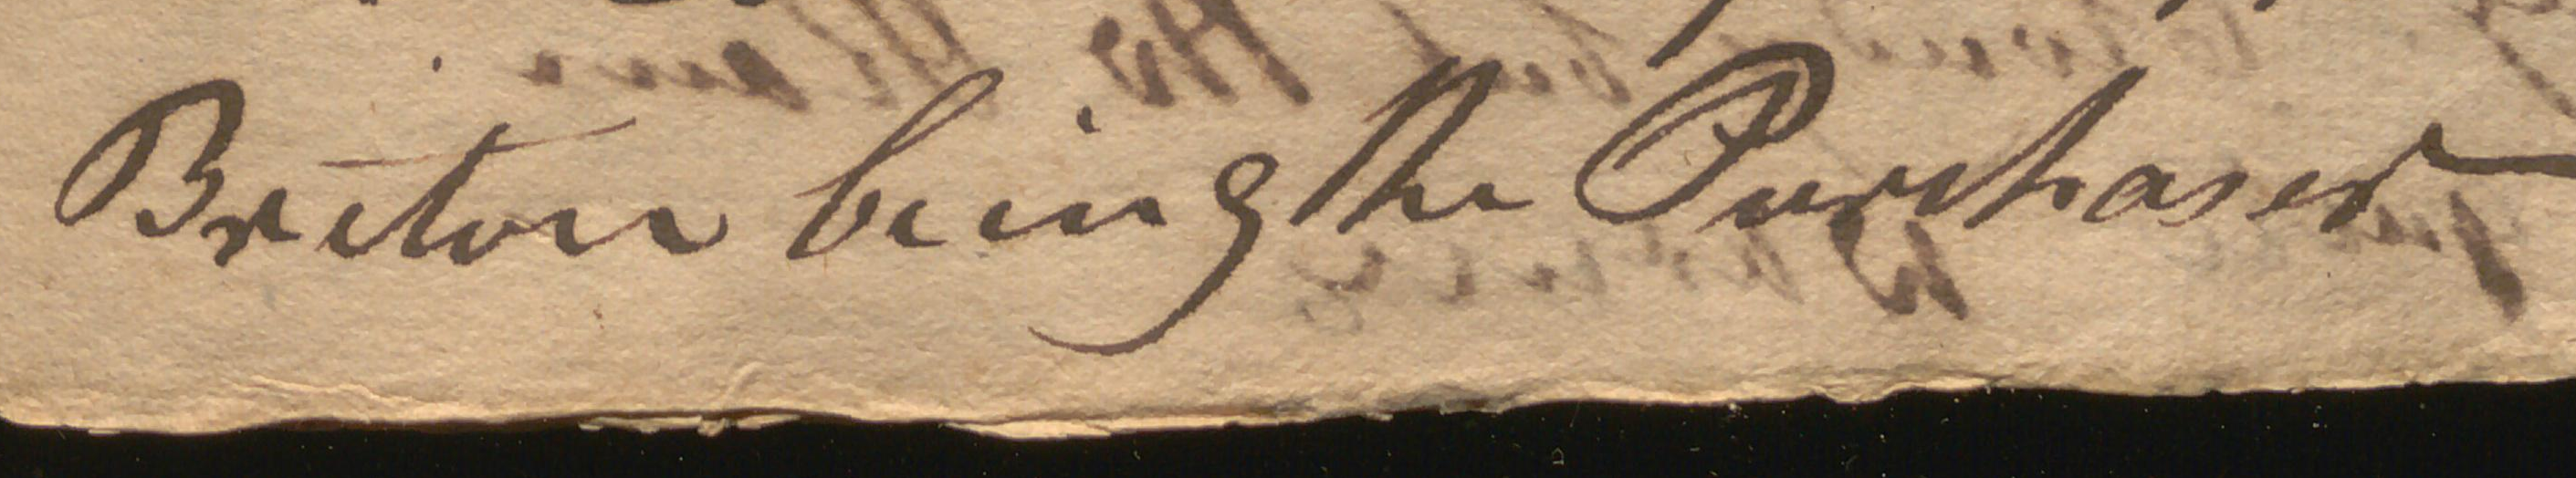Breton being the Purchaser
